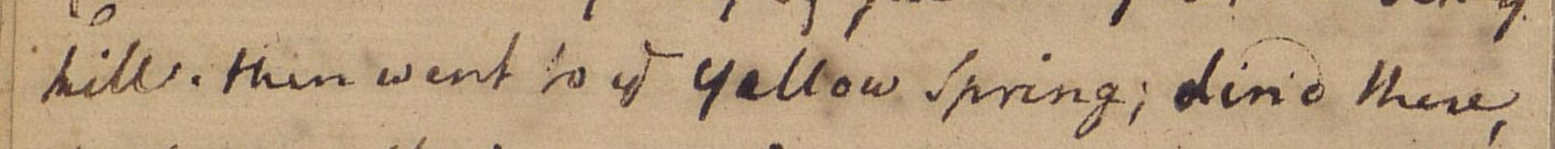hill. then went to y^e Yellow Spring; din'd there,
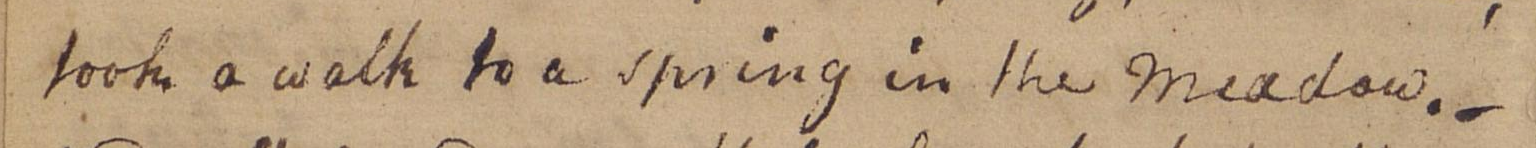took a walk to a spring in the meadow.-
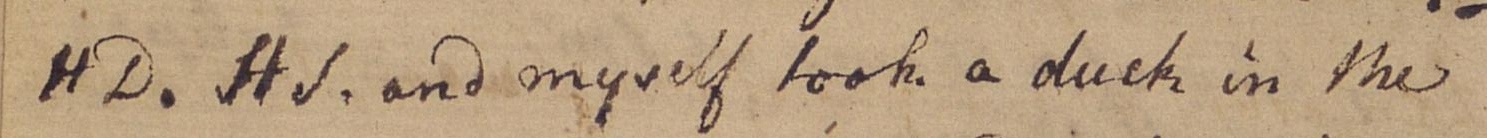HD. HS. and myself took a duck in the
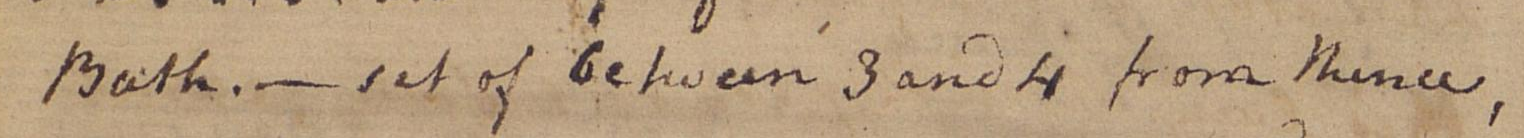Bath.- set of between 3 and 4 from thence,
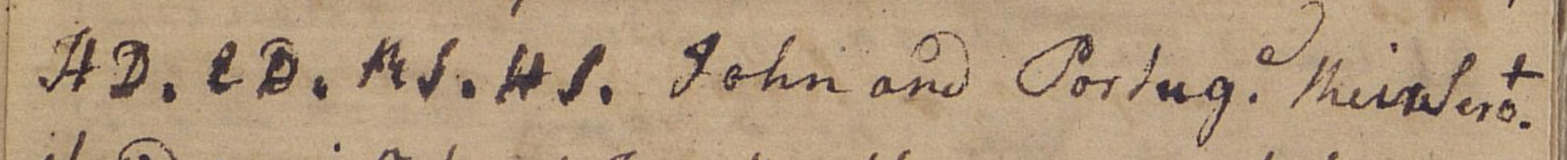HD. ED. MS. HS. John and Portug^d their Serv^t.
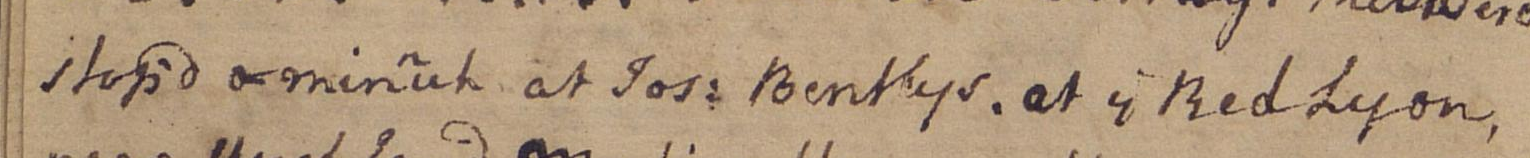stop'd a min^nut at Jos: Bentlys, at y^e Red Lyon,
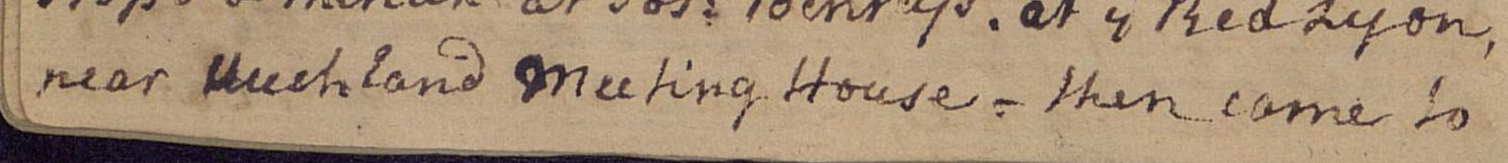near Hushland? Meeting House- then came to
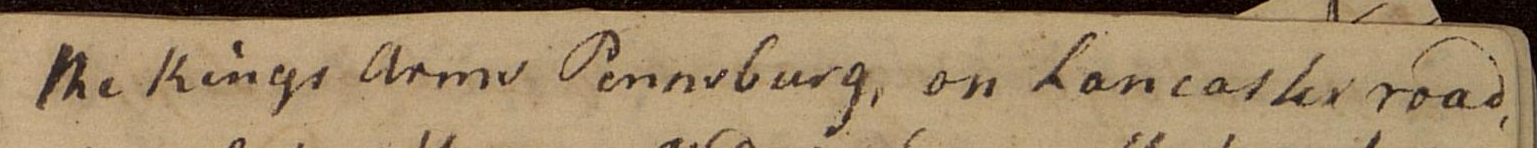the Kings Arms Pennsburg, on Lancaster road,
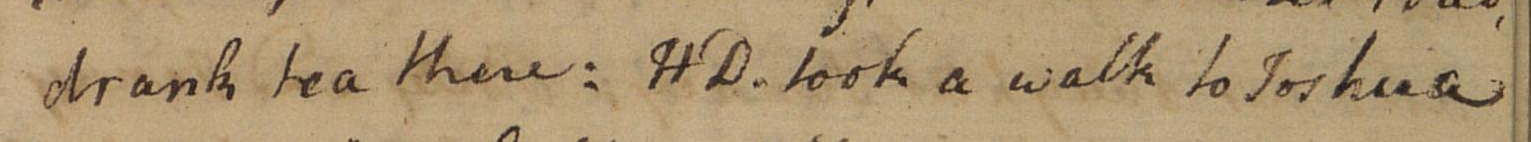drank tea there: HD. took a walk to Joshua
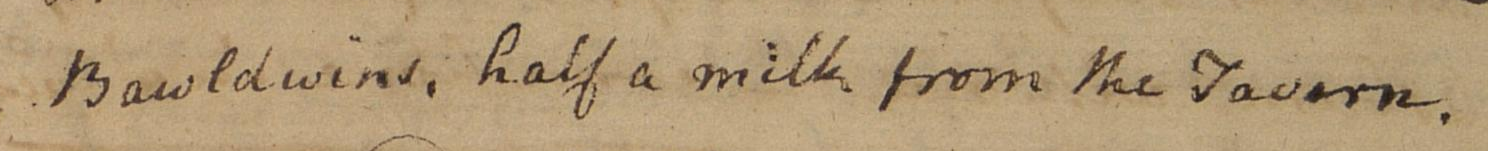Bawldwins, half a milk from the Tavern.
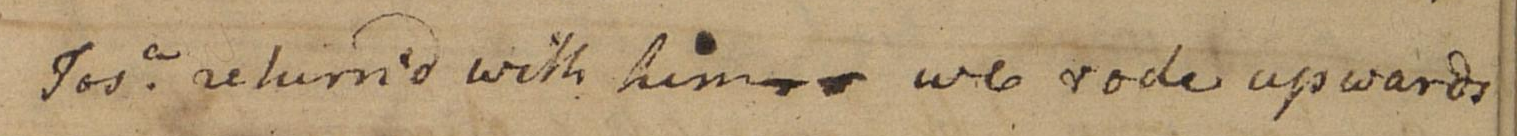Jos^a return'd with him we rode upwards
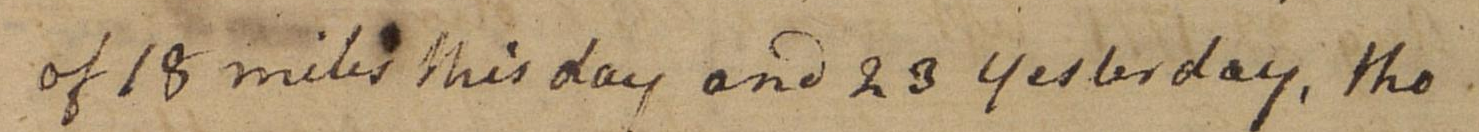of 18 miles this day and 23 Yesterday, tho
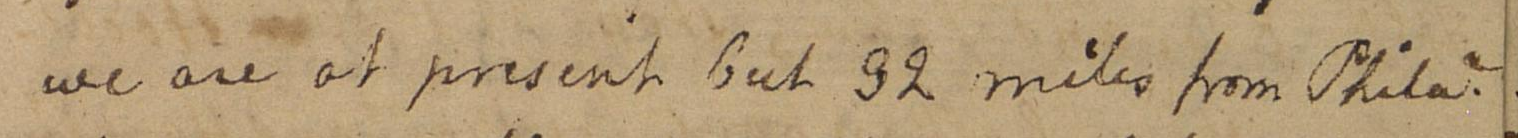we are at present but 32 miles from Phila^a.
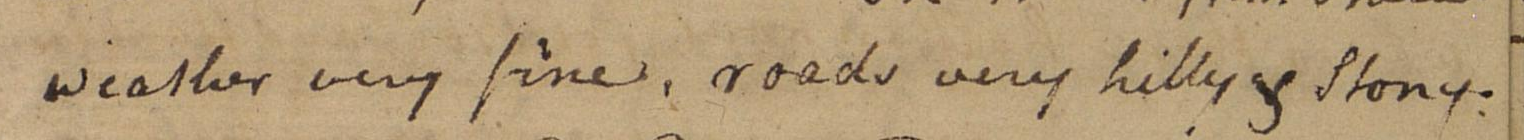weather very fine, roads very hilly & Stony.
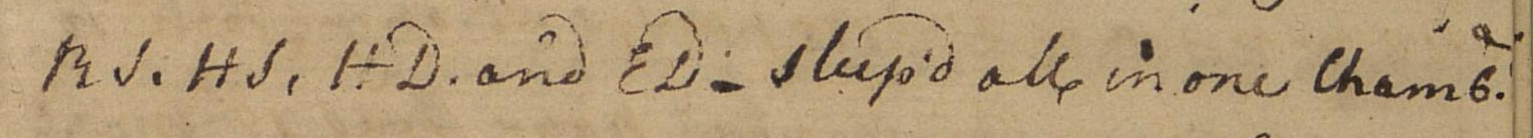RS. HS, HD. and ED- sleep'd all in one Chamb^r.
